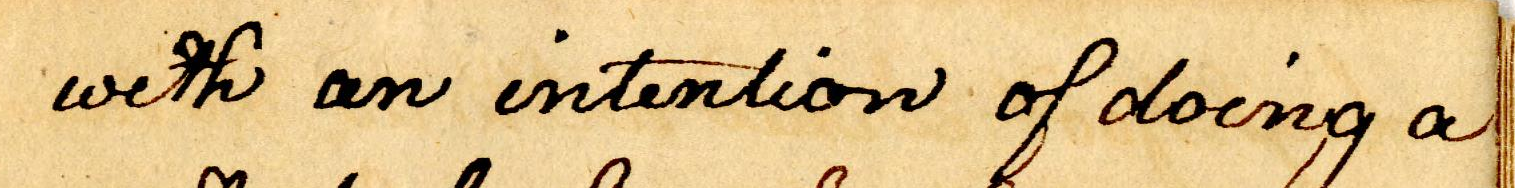with an intention of doing a
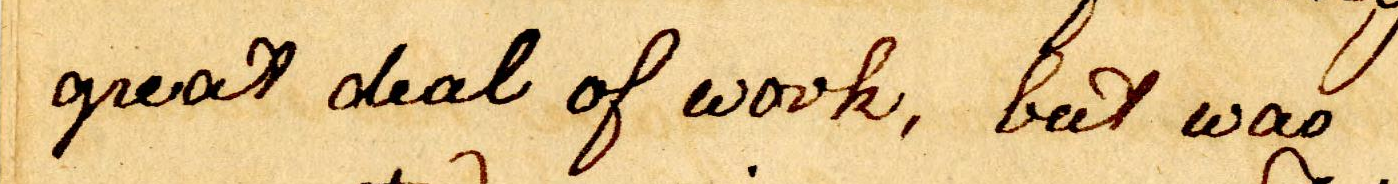great deal of work, but was
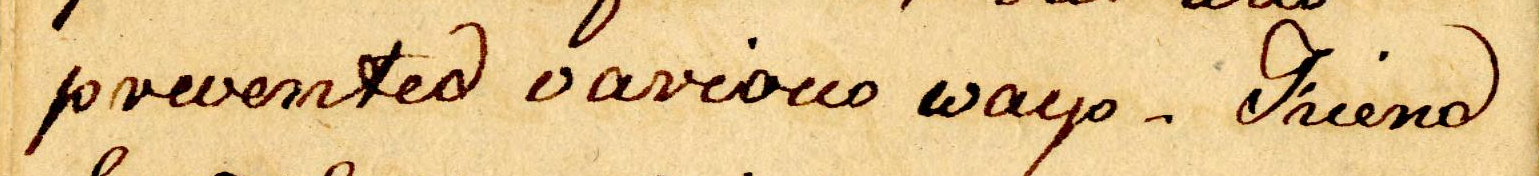prevented various ways- Friend
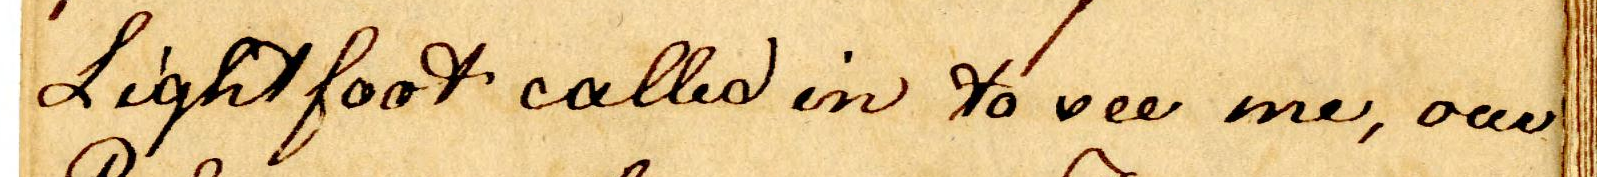Light foot called in to see me, our
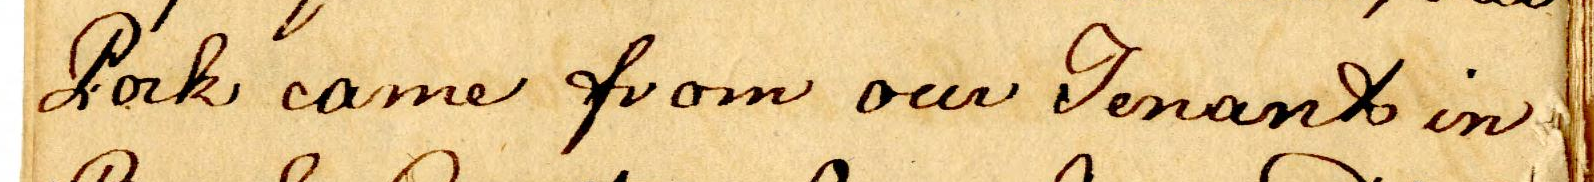Pork came from our Tenants in
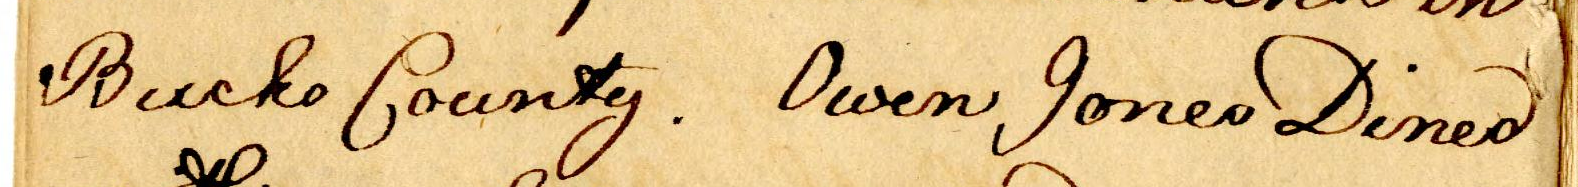Bucks County. Owen Jones Dined
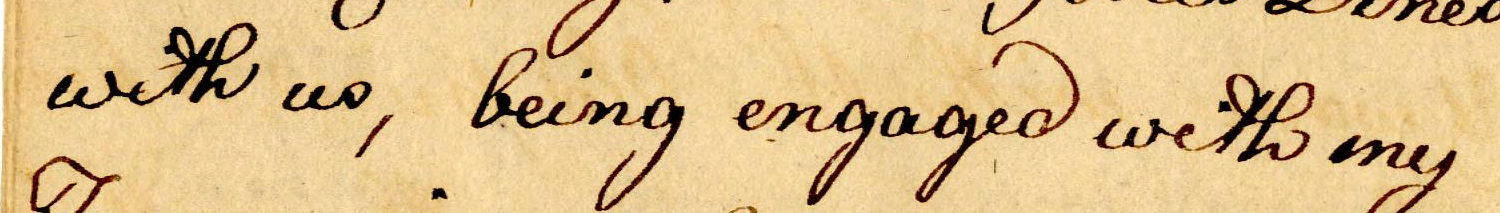with us, being engaged with my
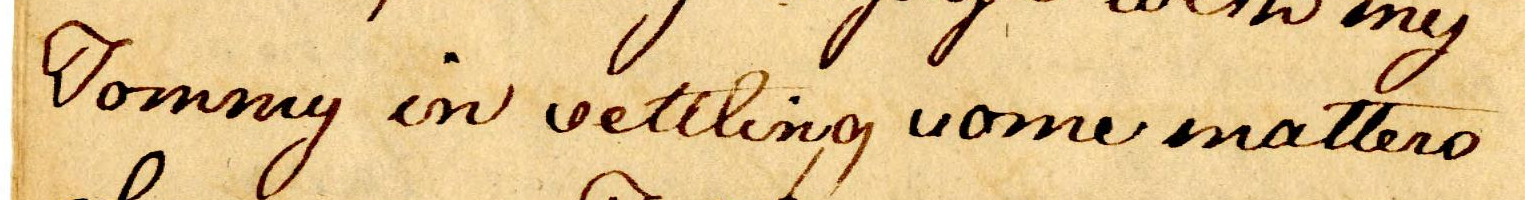Tommy in settling some matters
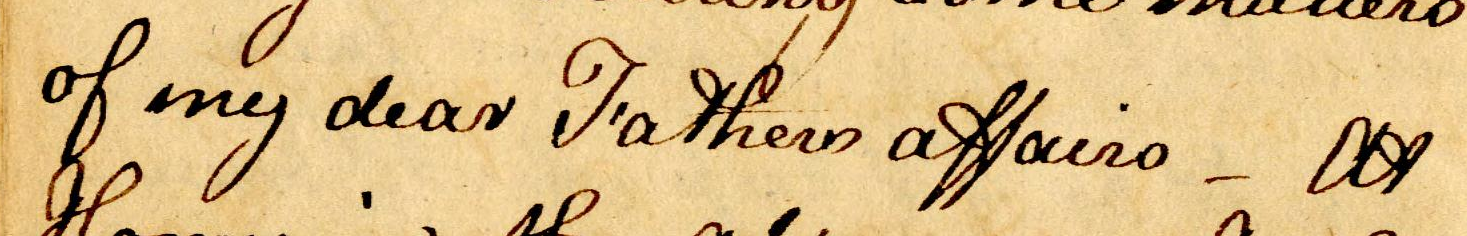of my dear Fathers affairs- At
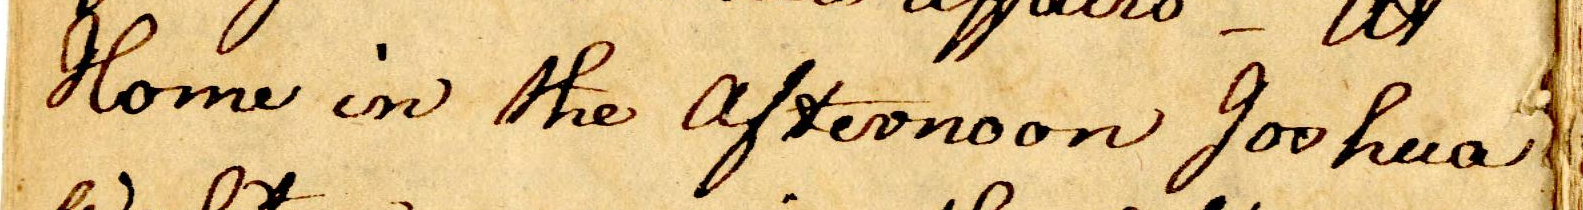Home in the Afternoon Joshua
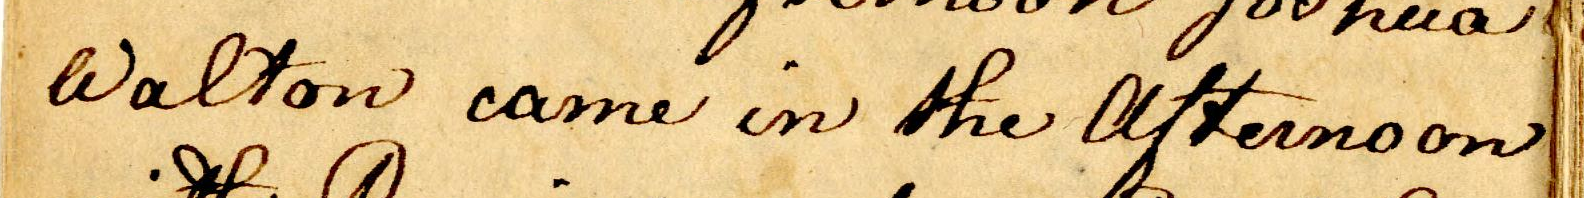Walton came in the Afternoon
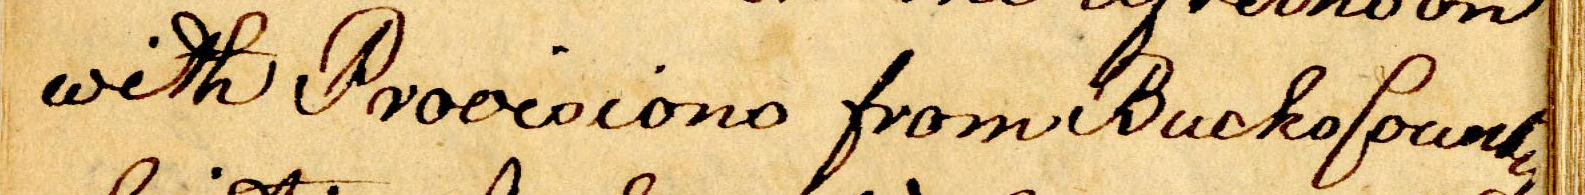with Provisions from Bucks County
